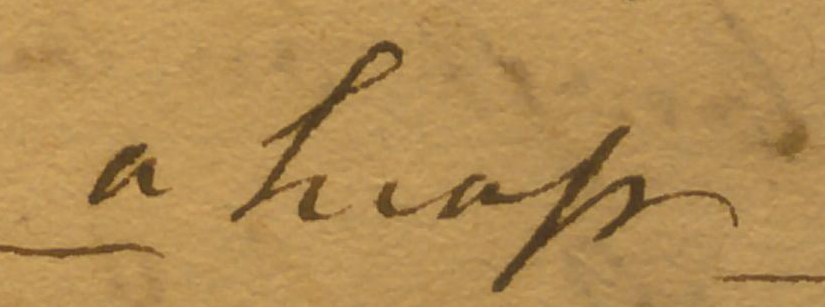a heap
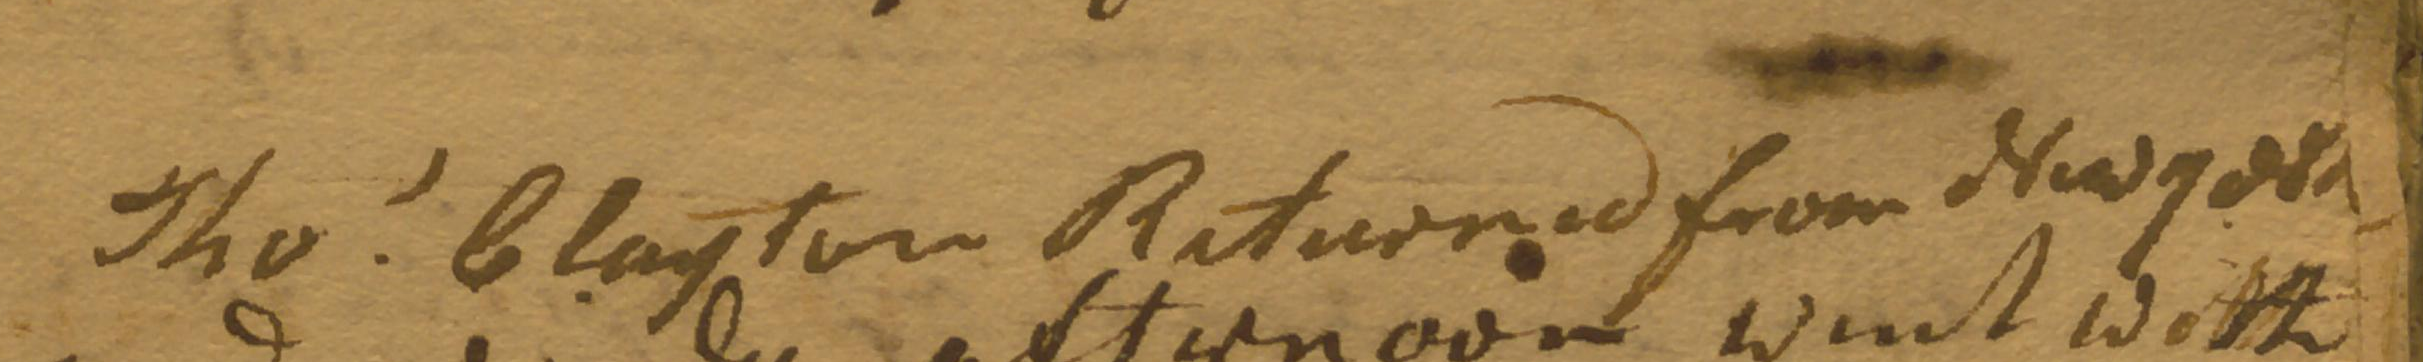Tho^s. Clayton Returned from New york
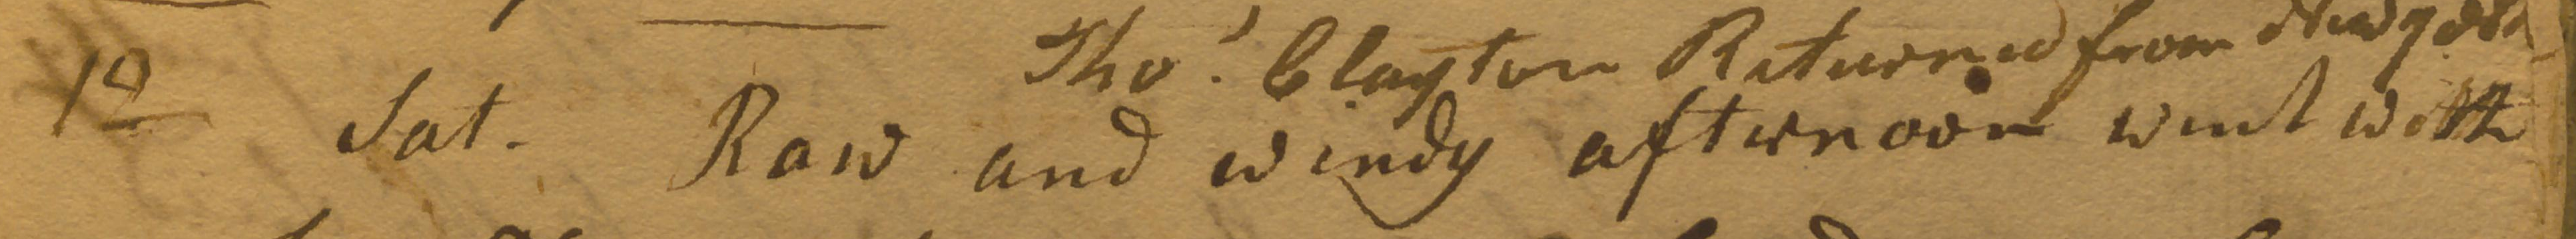12 Sat. Raw and windy afternoon went with
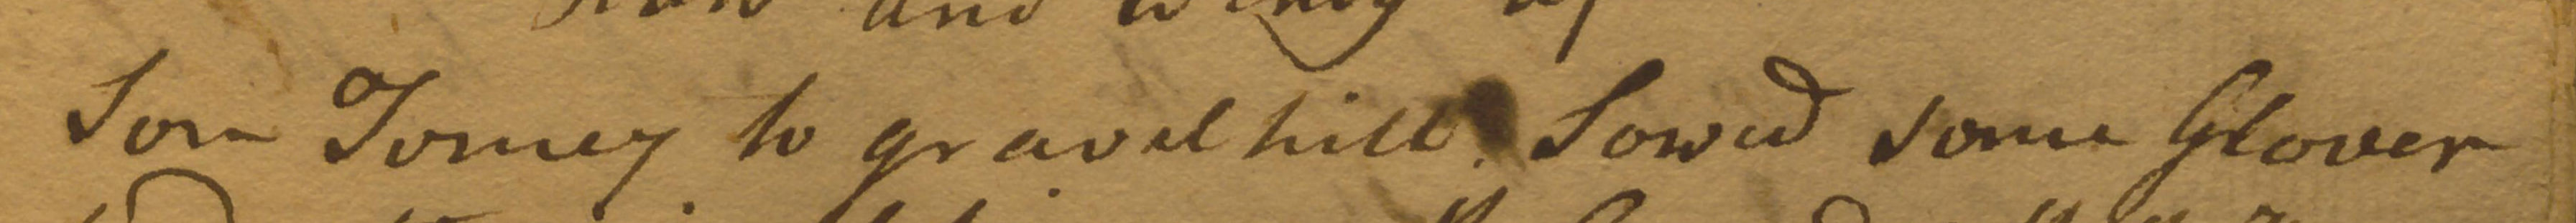Son Tomey to gravel hill. sowed some Glover
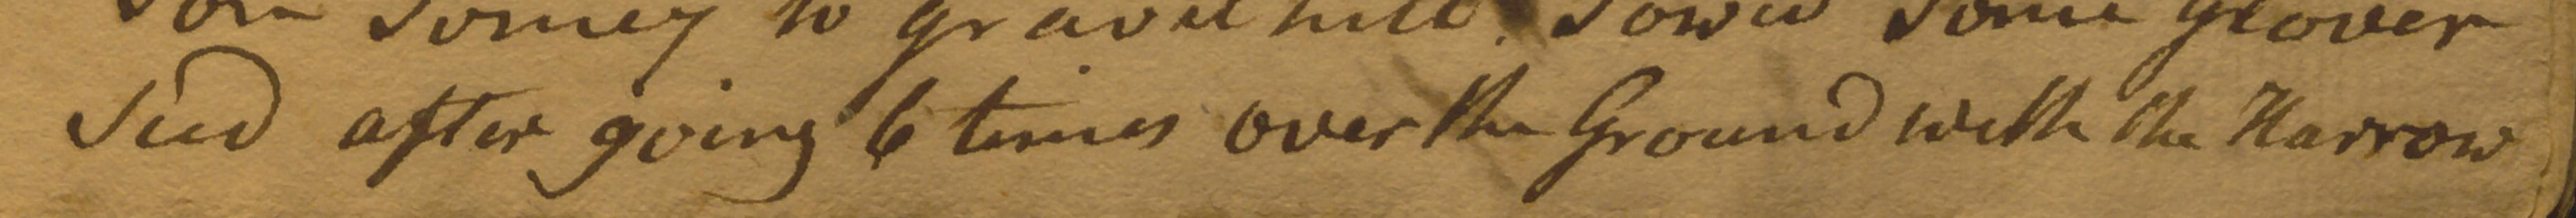seed after going 6 times over the Ground with the Harrow
